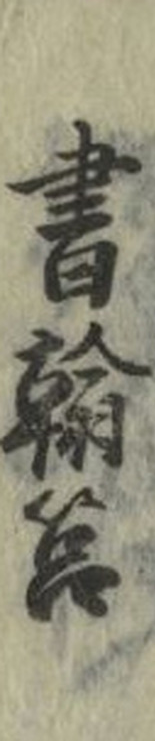書翰箱
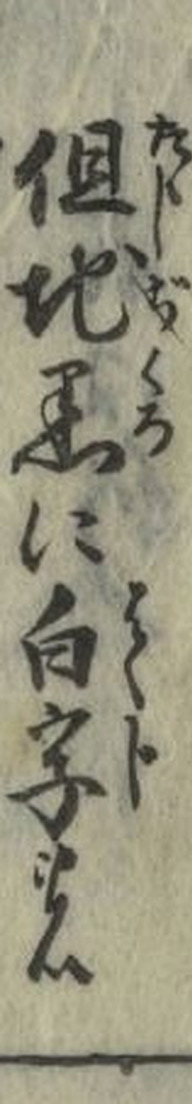但地黒に白字の
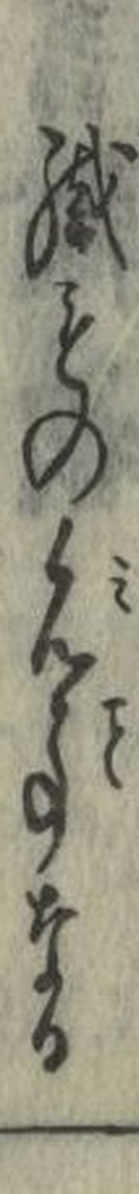織もの見事なる
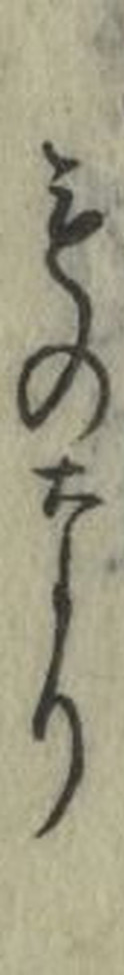ものなり

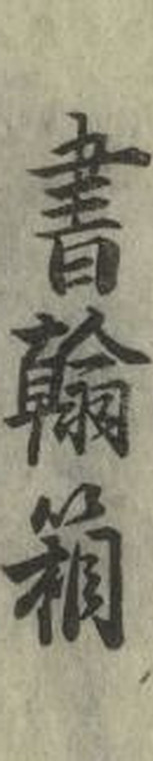書翰箱
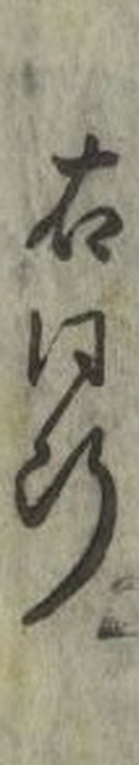右同行
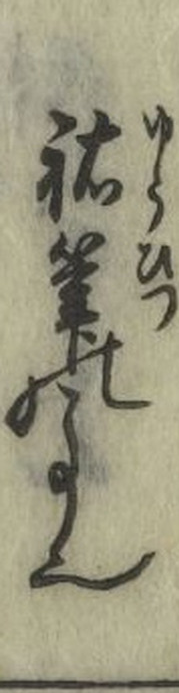祐筆の事也
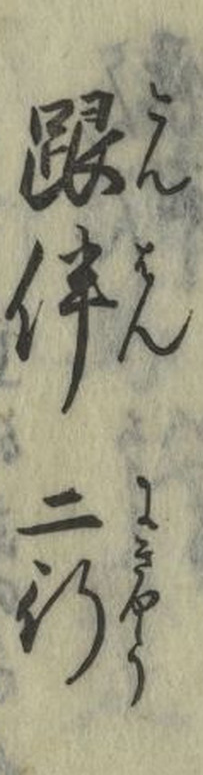跟伴二行
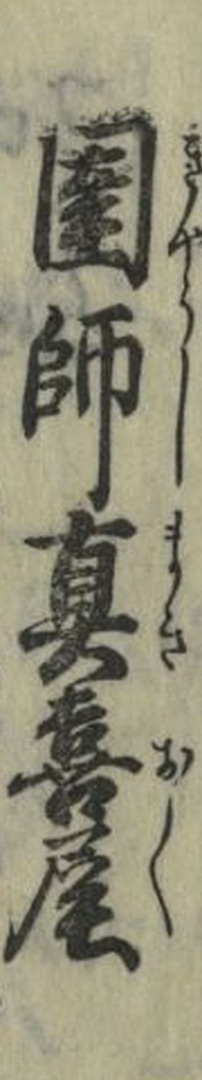圉師真喜屋
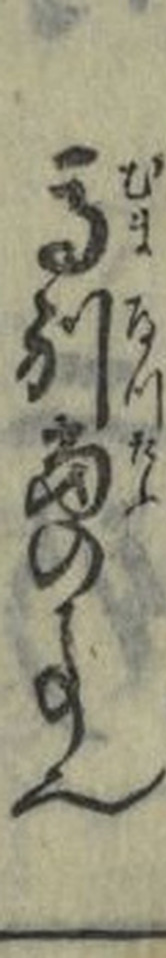馬別当の事也
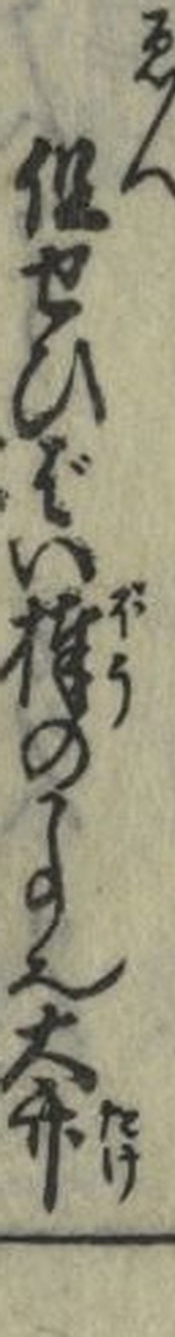但せひばい棒の事也大竹
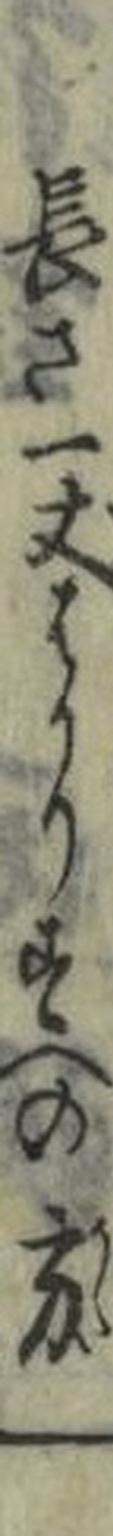長さ一𠀋はかりすへの方
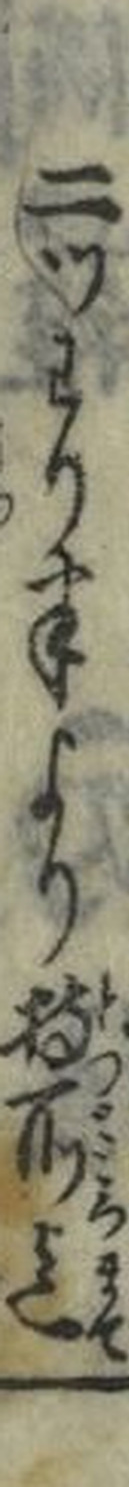二つわり半より持所迄
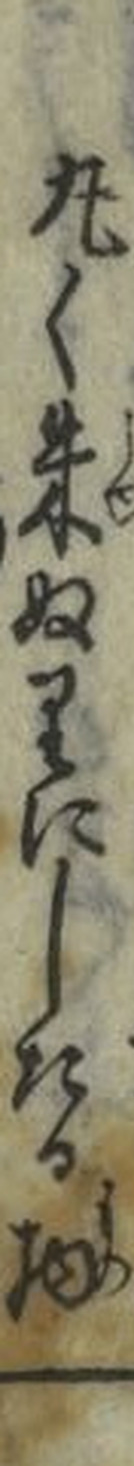丸く朱ぬりにしたる物
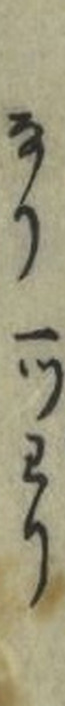なり一つわり
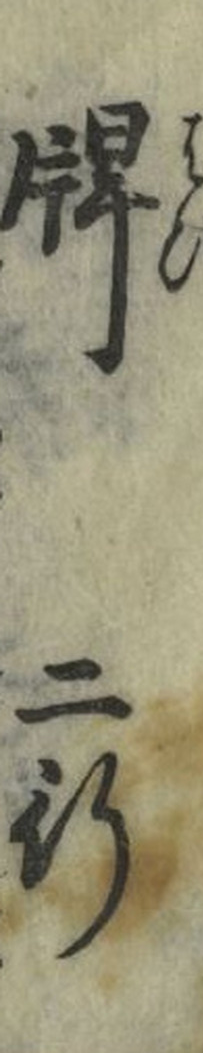牌二行
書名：琉球人大行列記
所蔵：University of the Ryukyus Library
